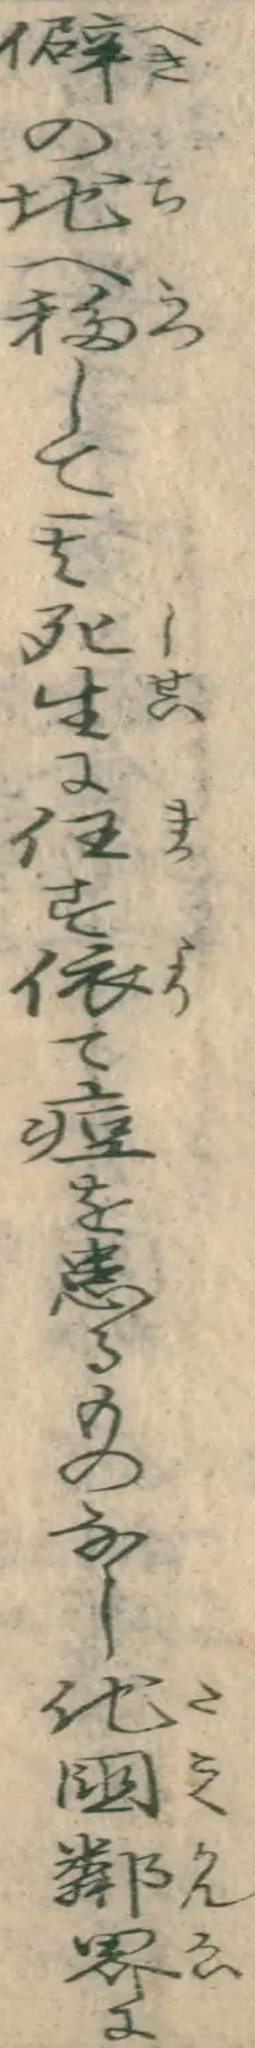僻の地へ移して其死生に任す依て痘を患るものなし他国隣界に
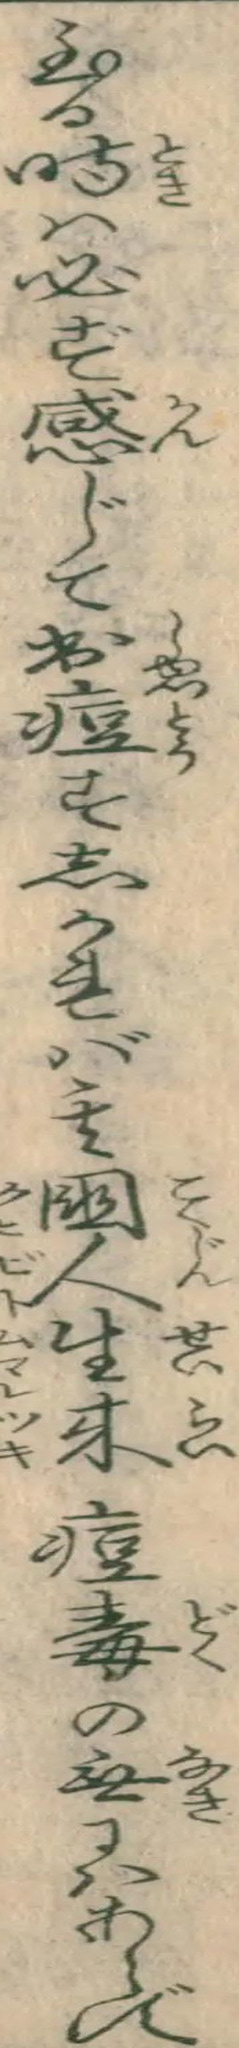至る時は必ず感じて出痘すしかればゝ其国人生来痘毒の無にはあゝず
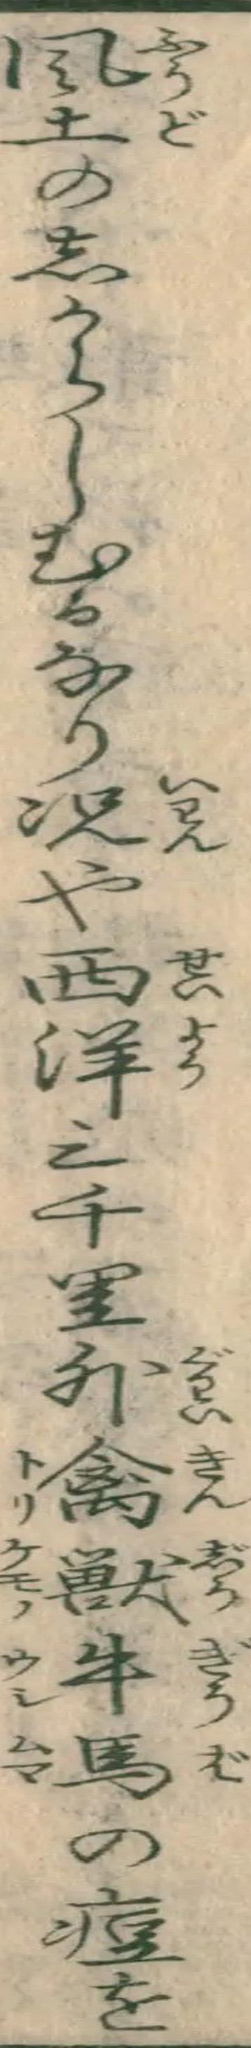風土のしからしむるなり況や西洋三千里外禽獣牛馬の痘を
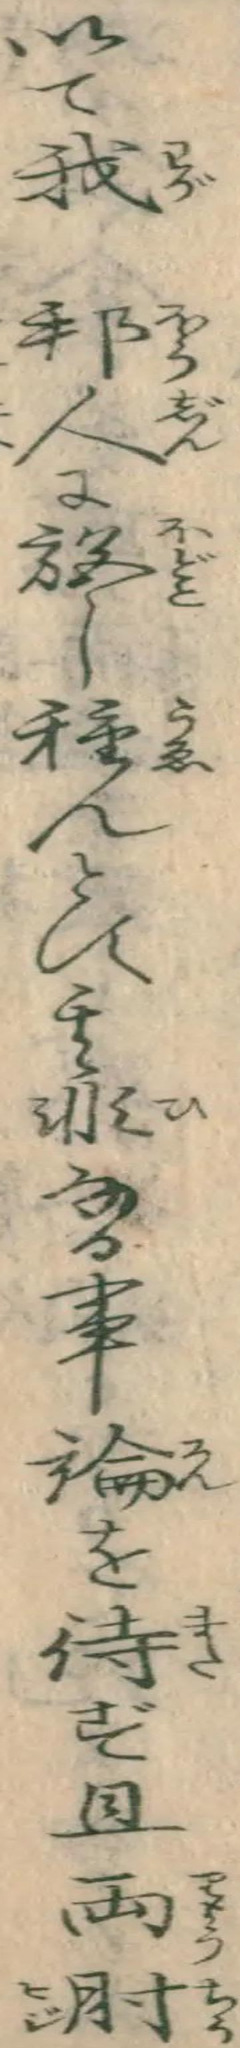以て我邦人に施し種んとす其非なる事論を待ず且両肘
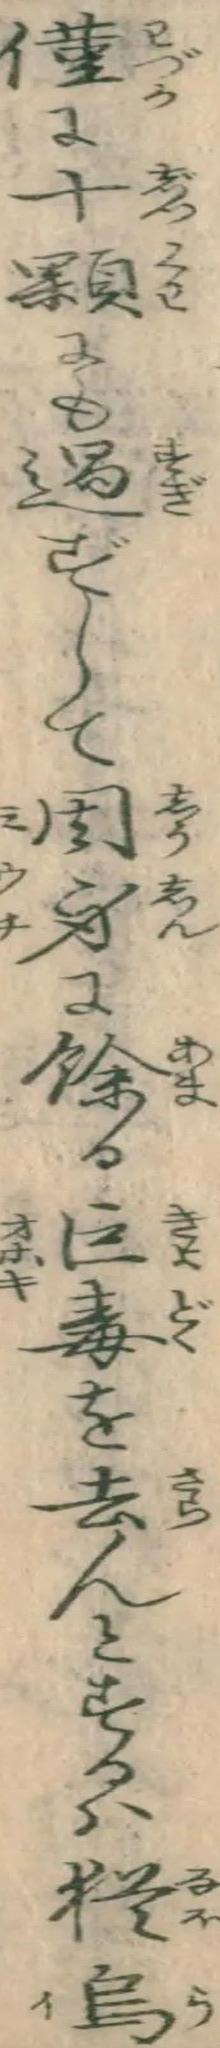僅に十顆にも過ずして周身に餘る巨毒を去んとするは猶烏
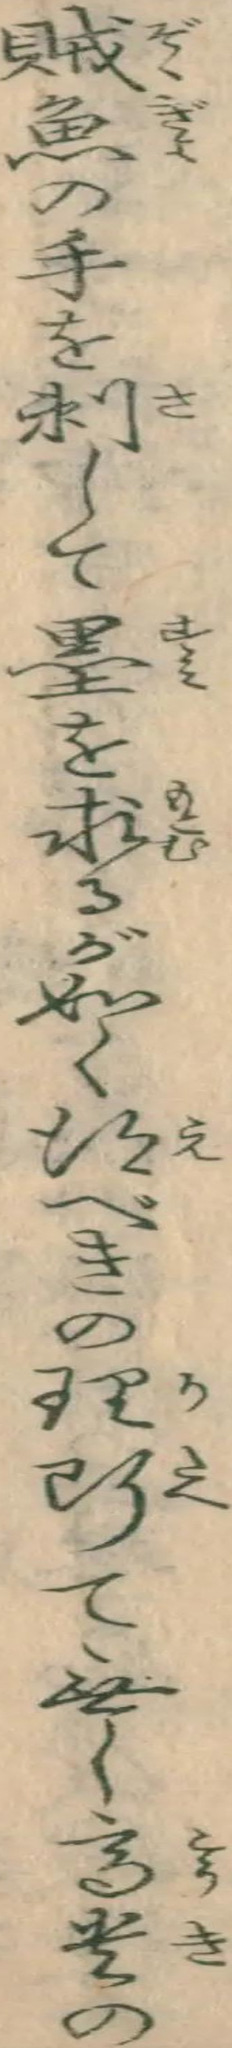賊魚の手を刺して墨を求るが如く得べきの理断て無し高貴の
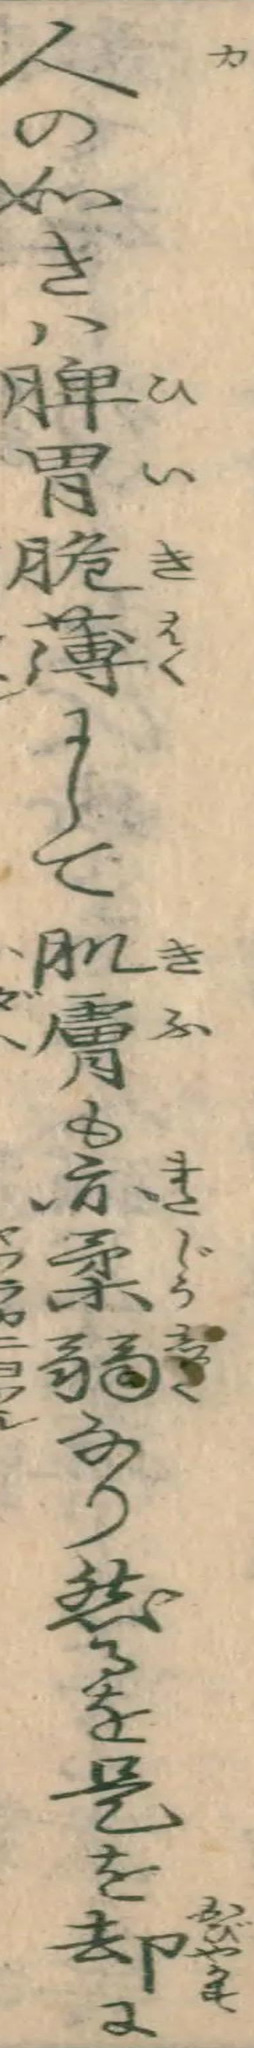人の如きは脾胃脆薄にして肌膚も亦柔弱なり然るを是を却に
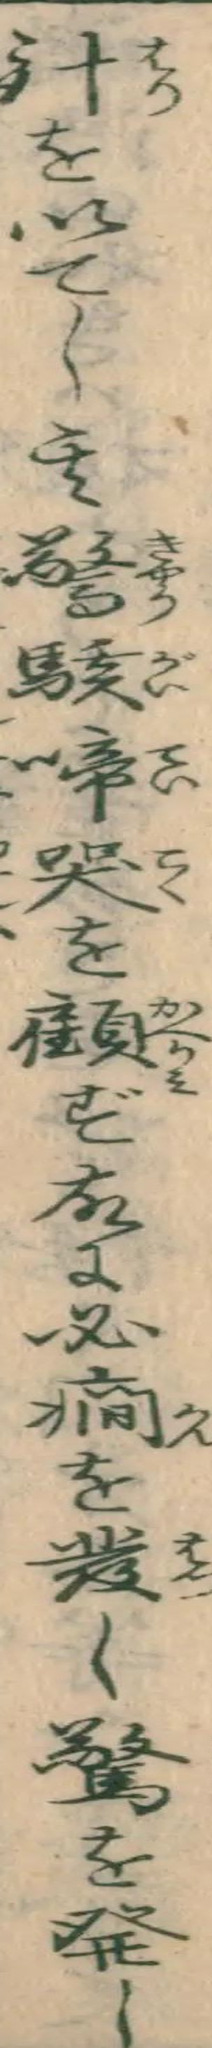針を以てし其驚駭啼哭顧ず故に必癇を発し驚を発し
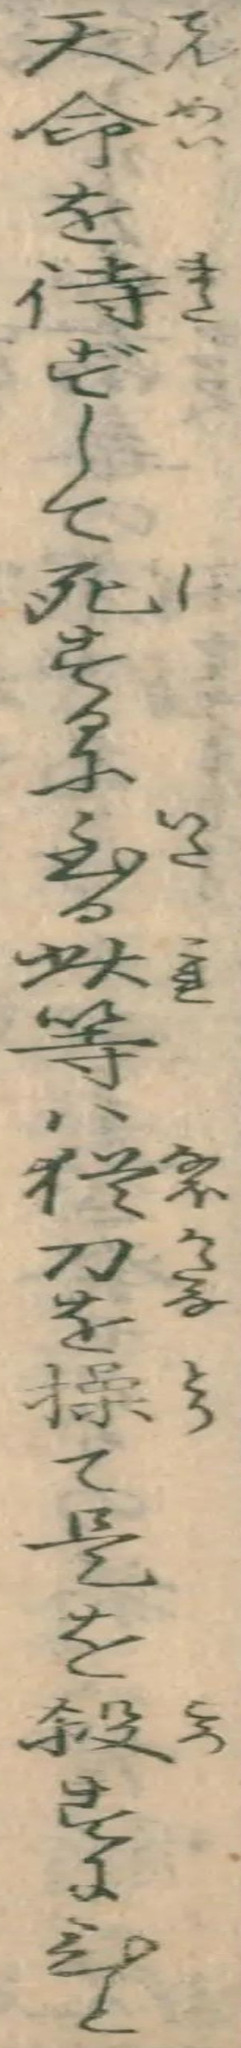天命を待ずして死するに至る此等は猶刀を操て是を殺すにひと
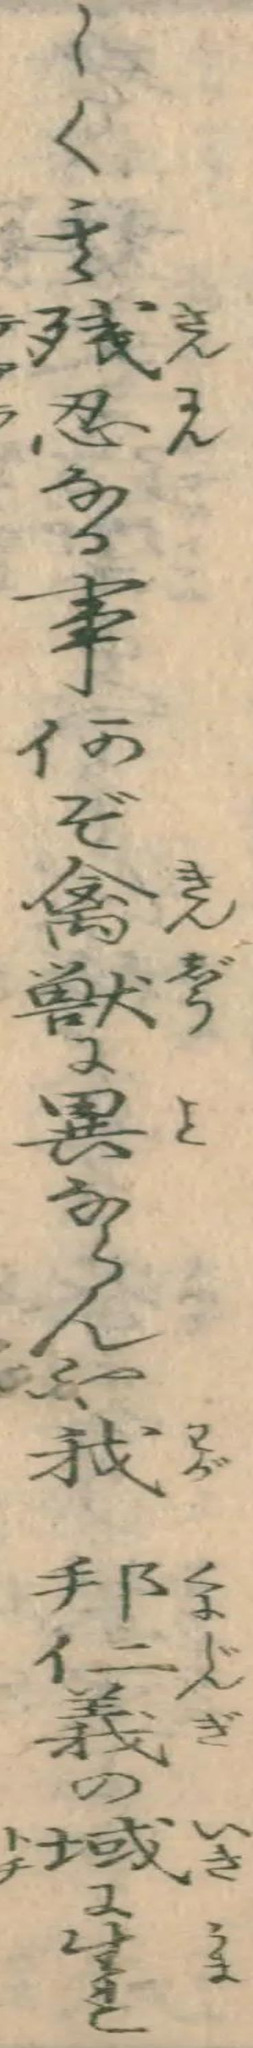しく其残忍なる事何ぞ禽獣に異ならんや我邦仁義の域に生れ
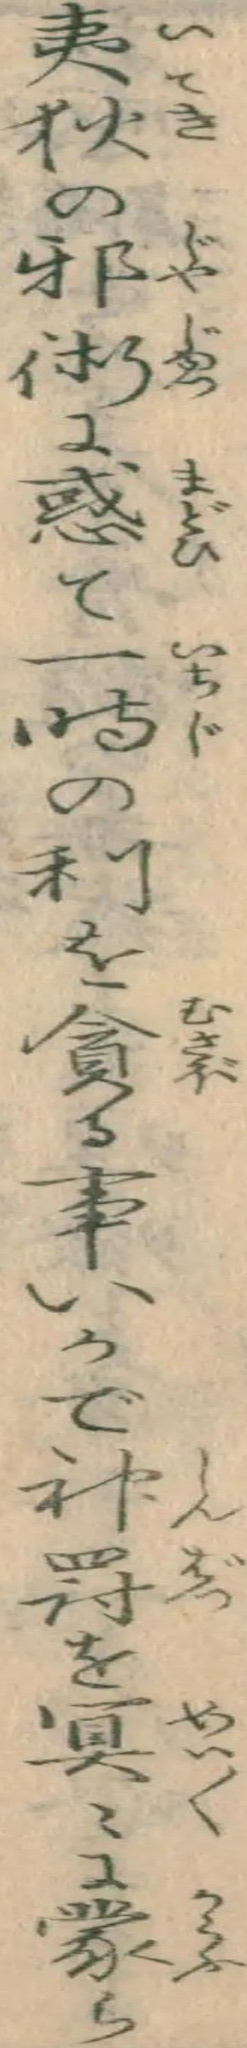夷狄の邪術に惑て一時の利を貪る事いかで神罰を冥々に家ら
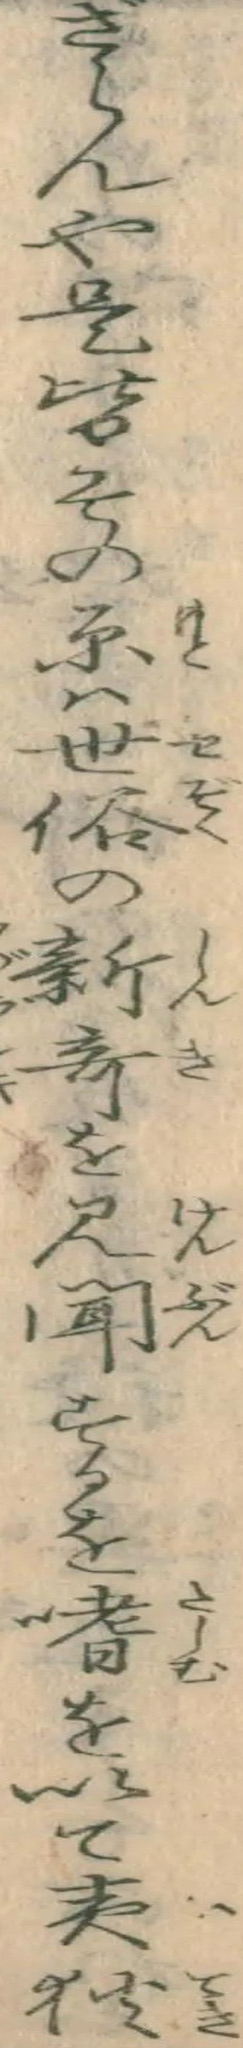ざらんや是皆その原は世俗の新奇を見聞するを嗜を以て夷狄
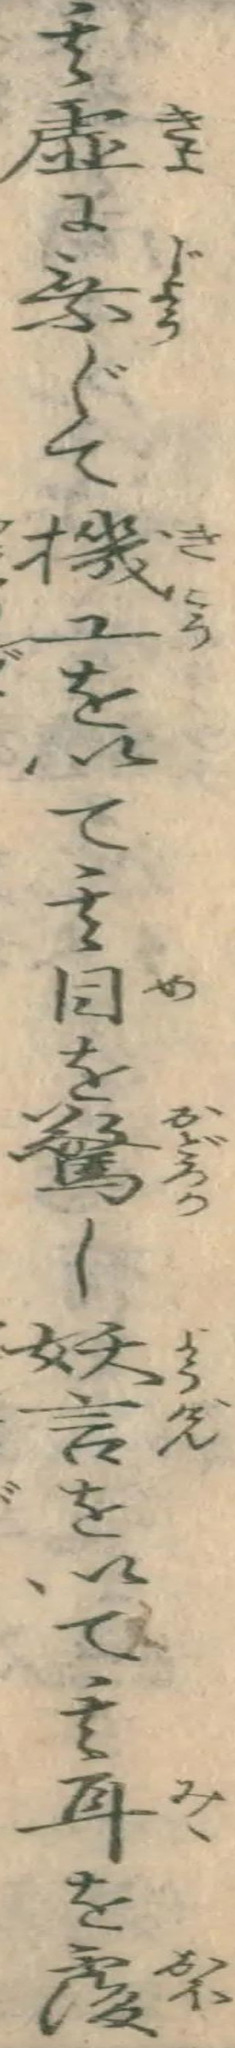其虚に乗じて機工を以て其目を驚し妖言を以て其耳を覆
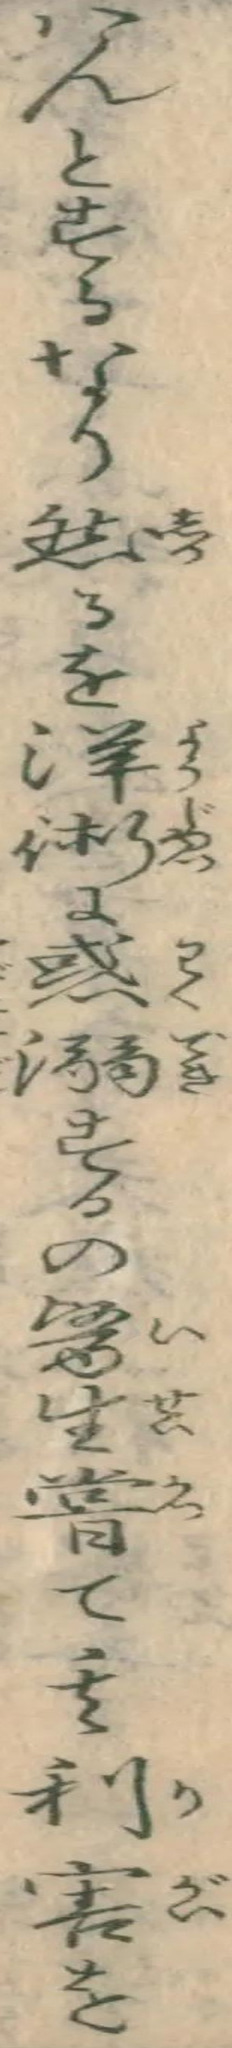はんとするなり然るを洋術に惑溺するの醫生嘗て其利害
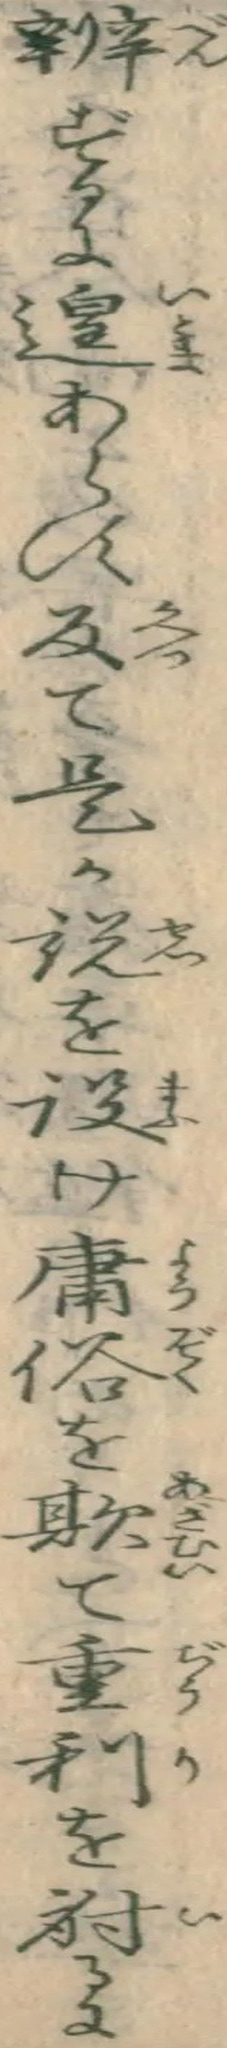辨ずるに遑あらず反て是々説を設け庸俗を欺て重利を射るに
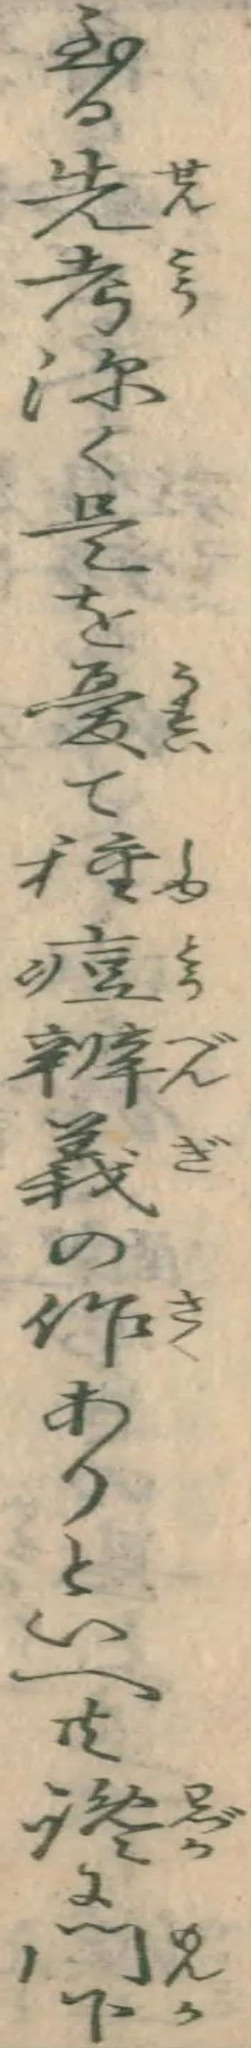至る先考深く是を憂て種痘辨義の作ありといへ其纔に門下
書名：牛痘辨非
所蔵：国立国会図書館 National Diet Library, JAPAN
